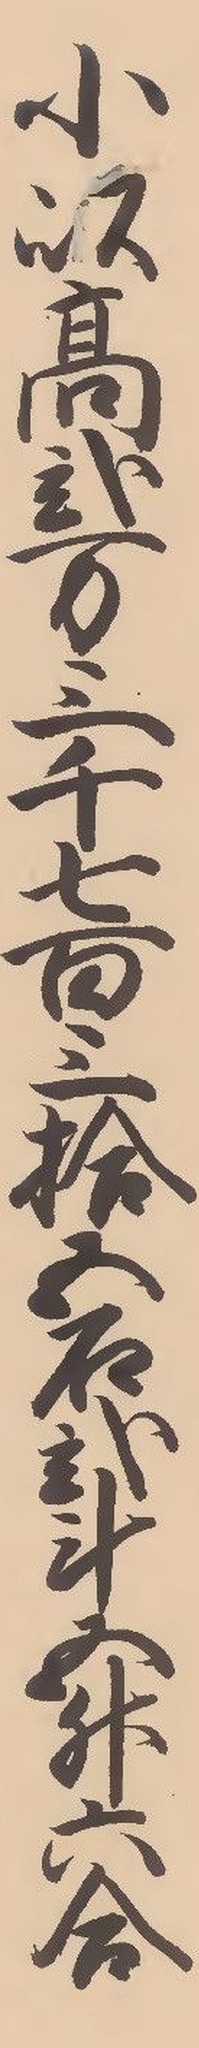小以高弐万三千七百三拾五石弐斗五升六合

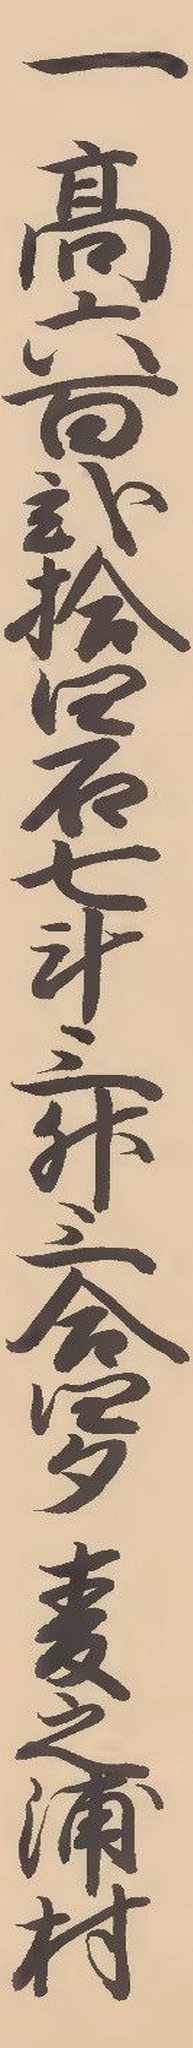一高六百弐拾四石七斗三升三合四勺麦之浦村
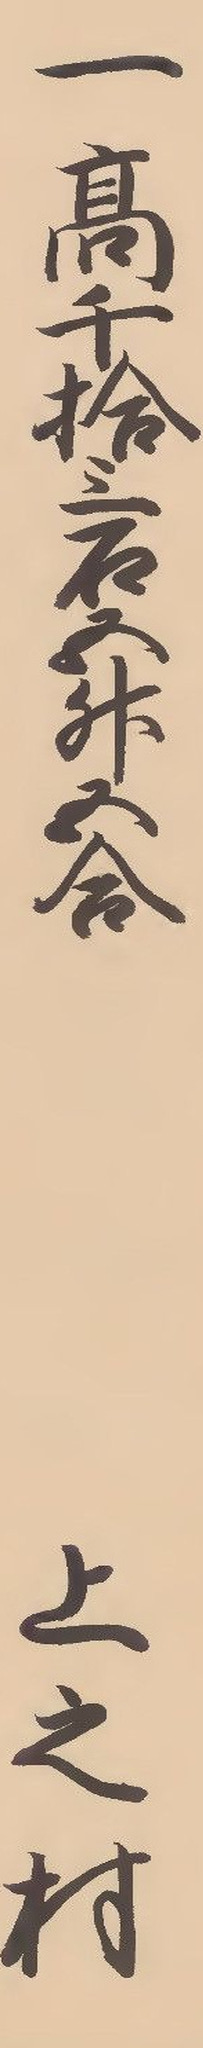一高千拾三石五升五合上之村
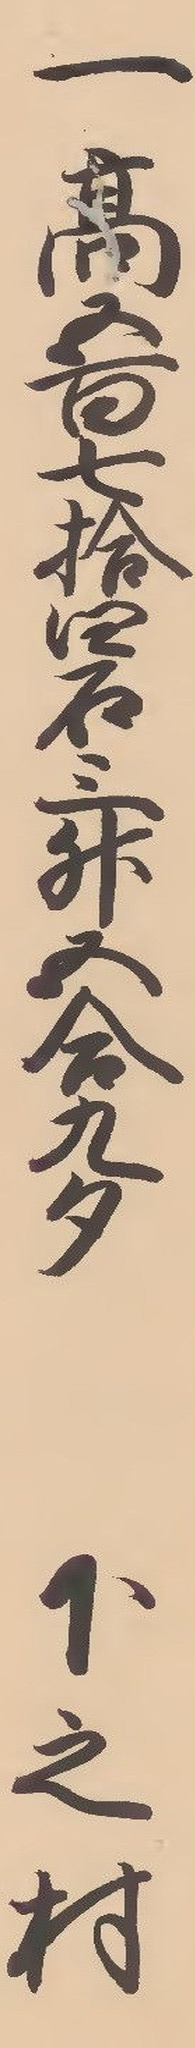一高五百七拾四石三升五合九勺下之村
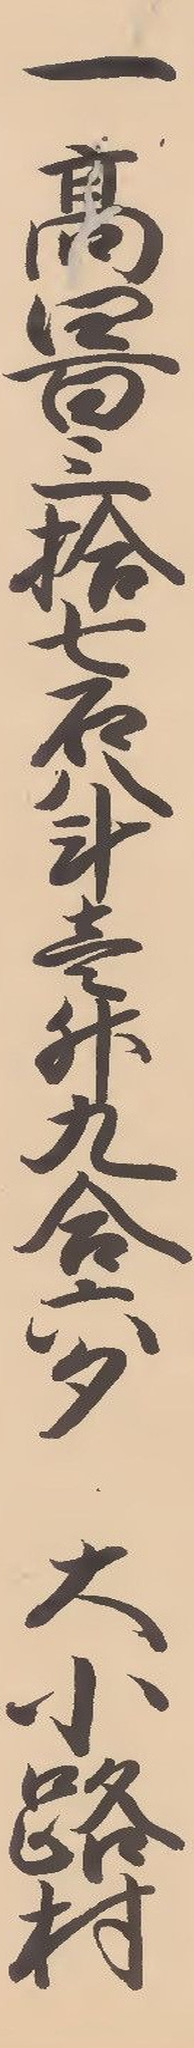一高四百三拾七石八斗壱升九合六勺大小路村
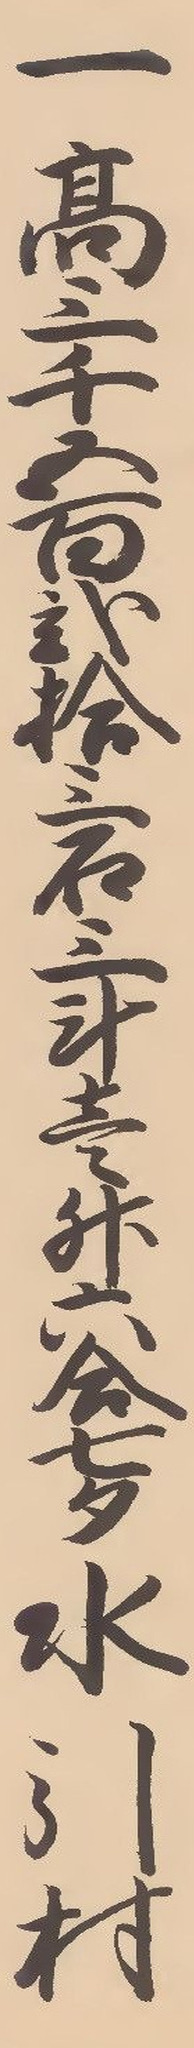一高三千五百弐拾三石三斗壱升六合七勺水引村
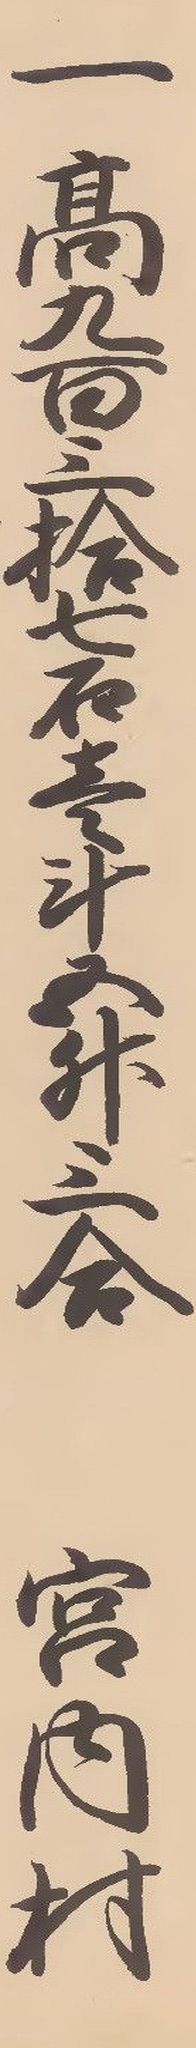一高九百三拾七石壱斗五升三合宮内村
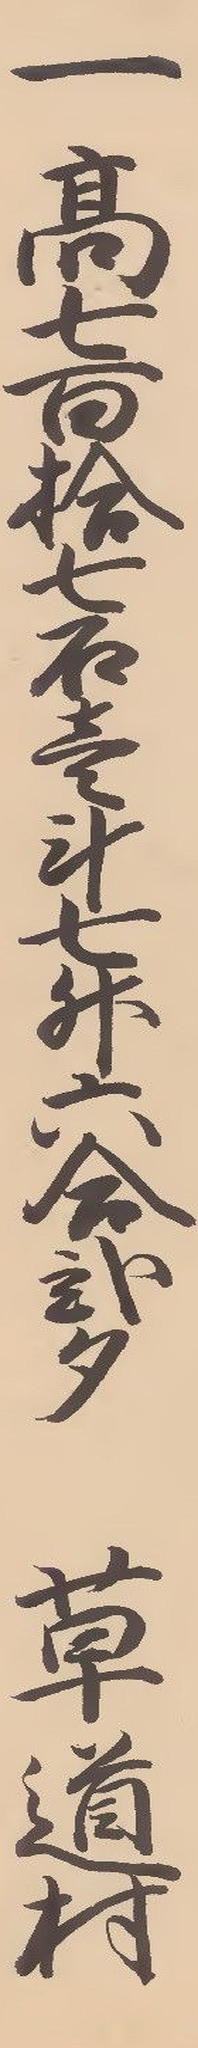一高七百拾七石壱斗七升六合弐勺草道村

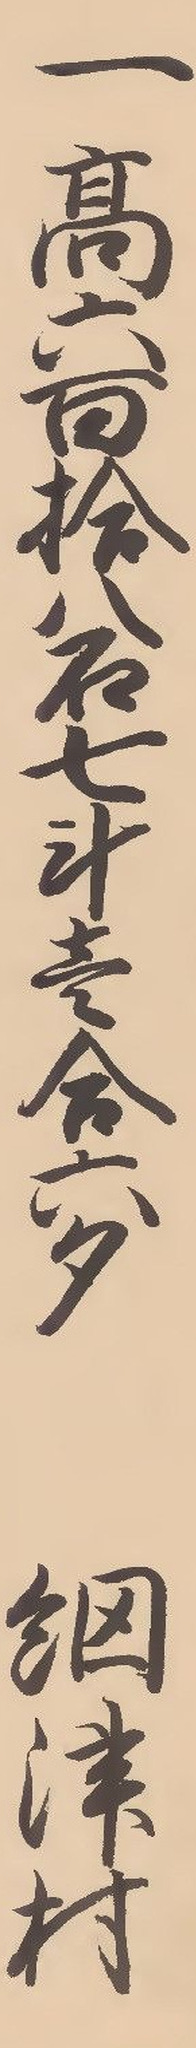一高六百拾八石七斗壱合六勺網津村
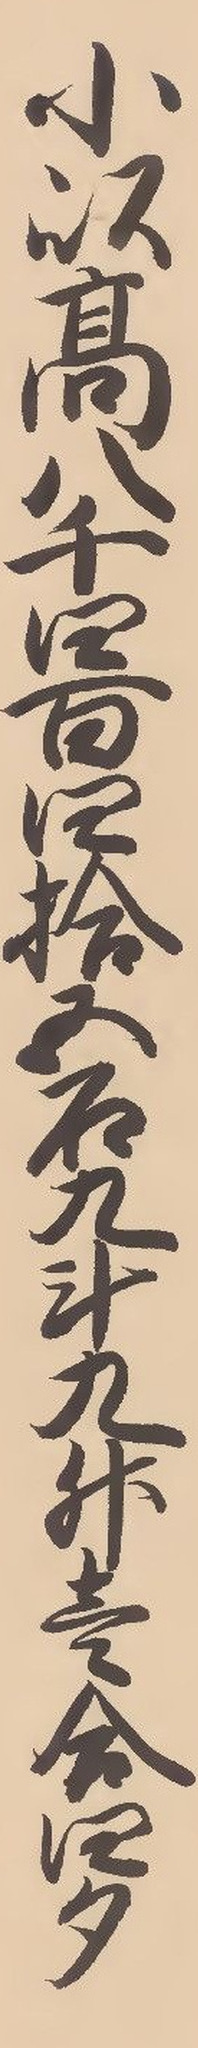小以高八千四百四拾五石九斗九升壱合四勺
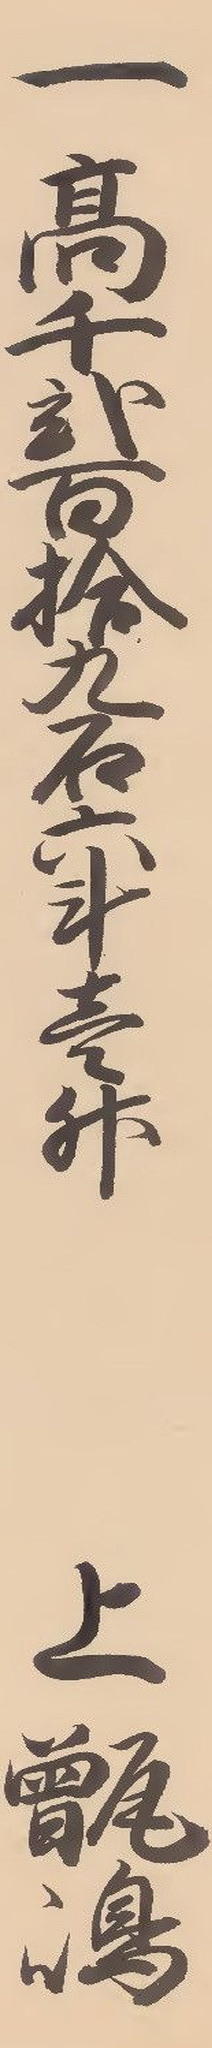一高千弐百拾九石六斗壱升上甑島
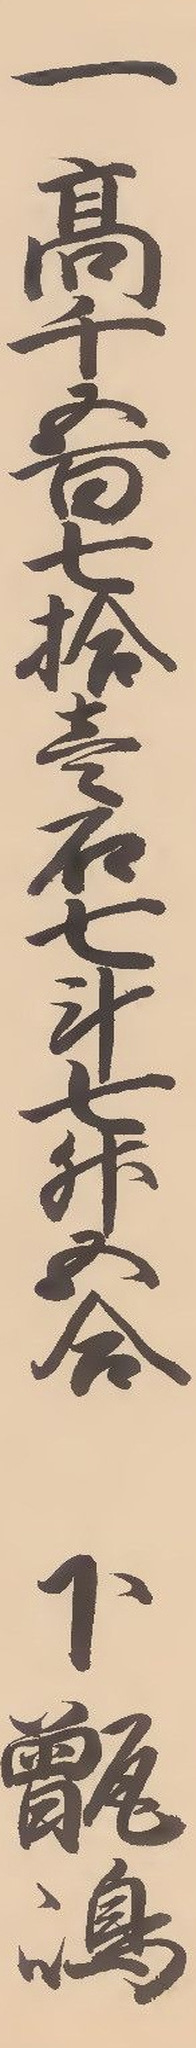一高千五百七拾壱石七斗七升五合下甑島
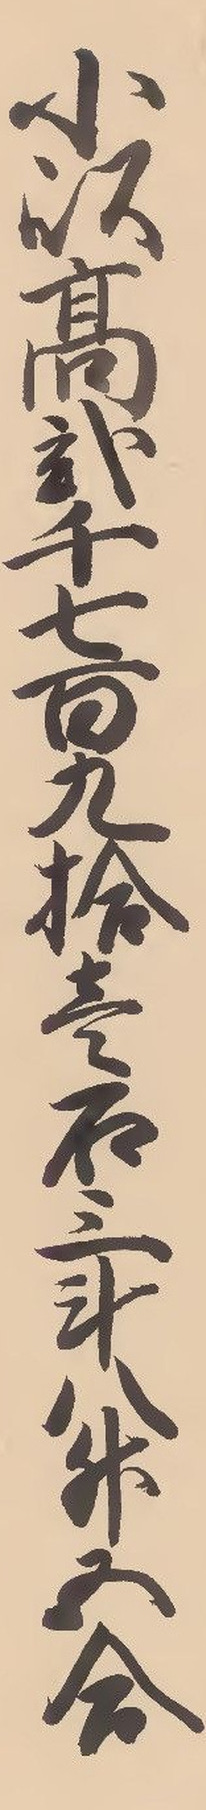小以高弐千七百九拾壱石三斗八升五合

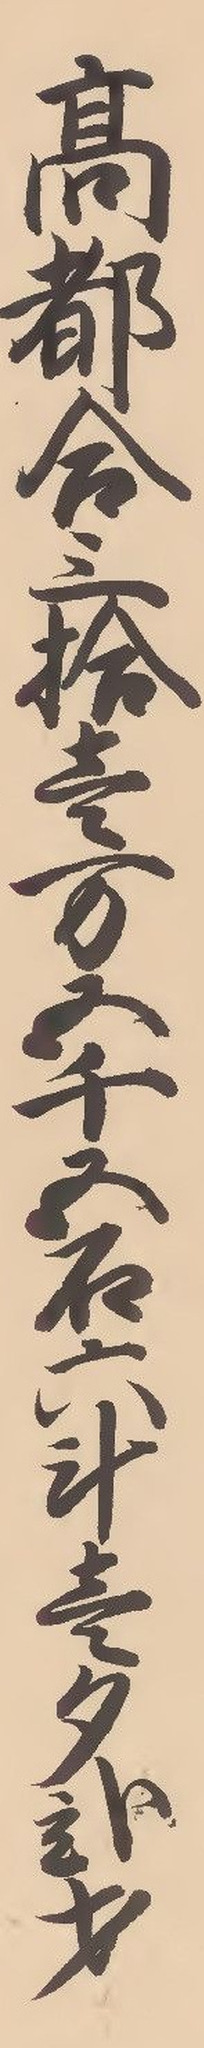高都合三拾壱万五千五石六斗壱勺弐才
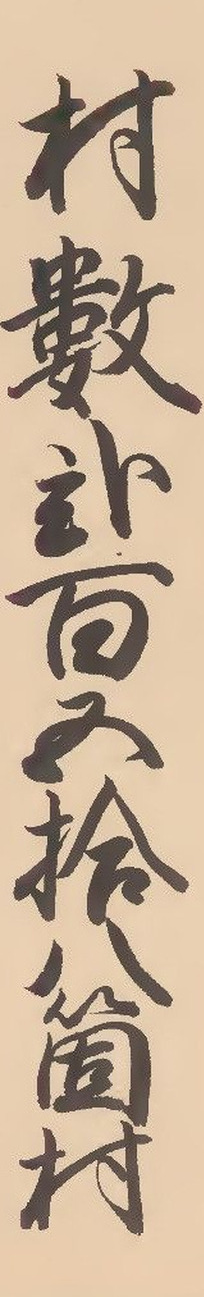村数弐百五拾八箇村
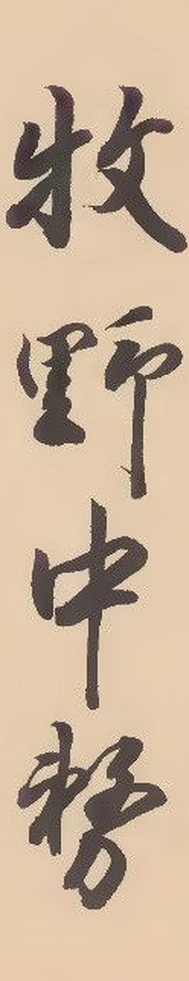牧野中務
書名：薩摩国郷帳
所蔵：国立公文書館 National Archives of Japan
